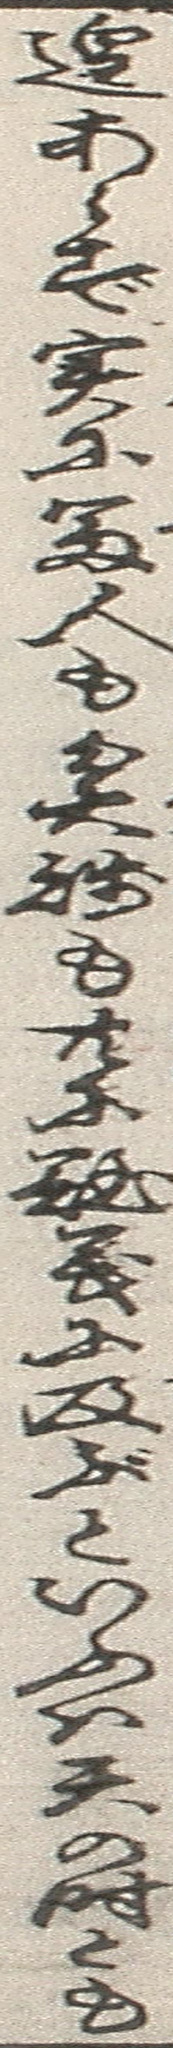遑あらず実に富人も貧銭も共に難義に及ぶといふハ天の時とも
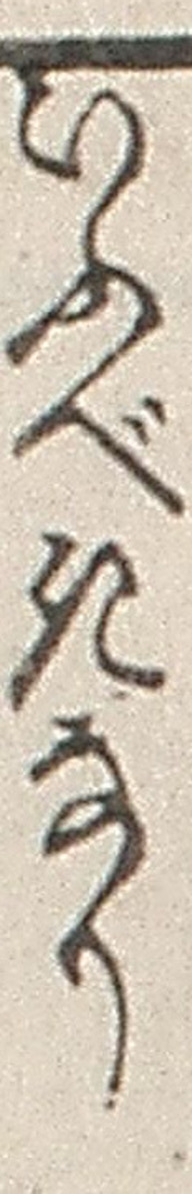いふべきなり
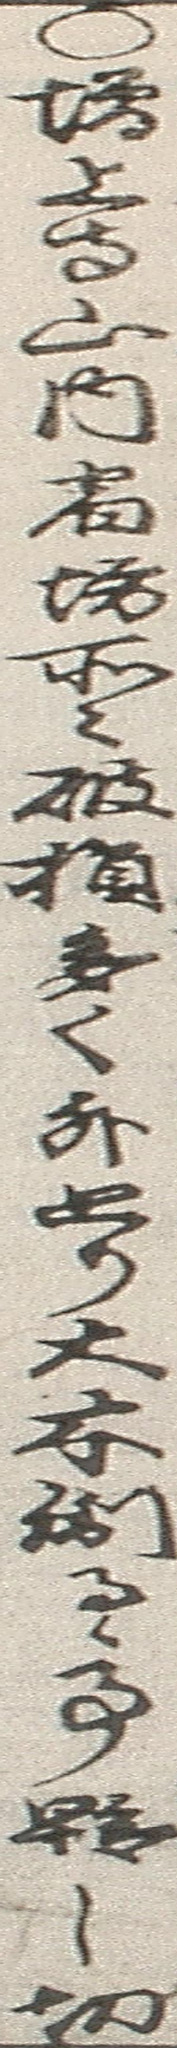◯増上寺山内宿坊所々破損多く外廻り大木倒るゝ事夥し切
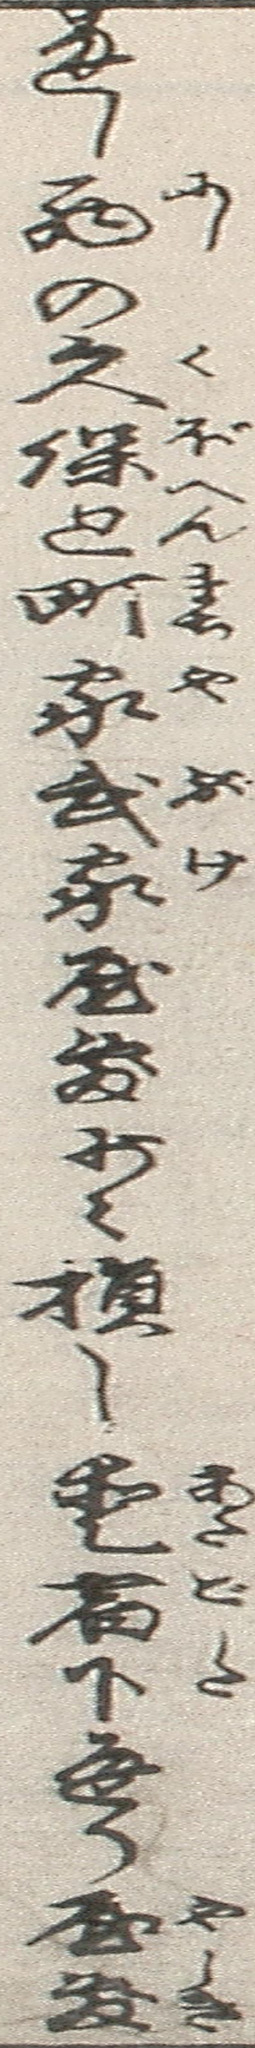通し西の久保辺町家武家屋敷少々損し愛宕下通り屋敷
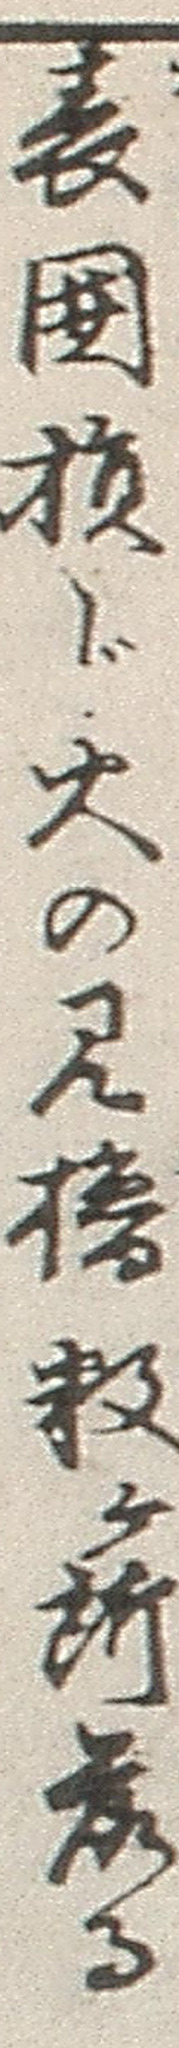表囲損じ火の見櫓数ヶ所落る
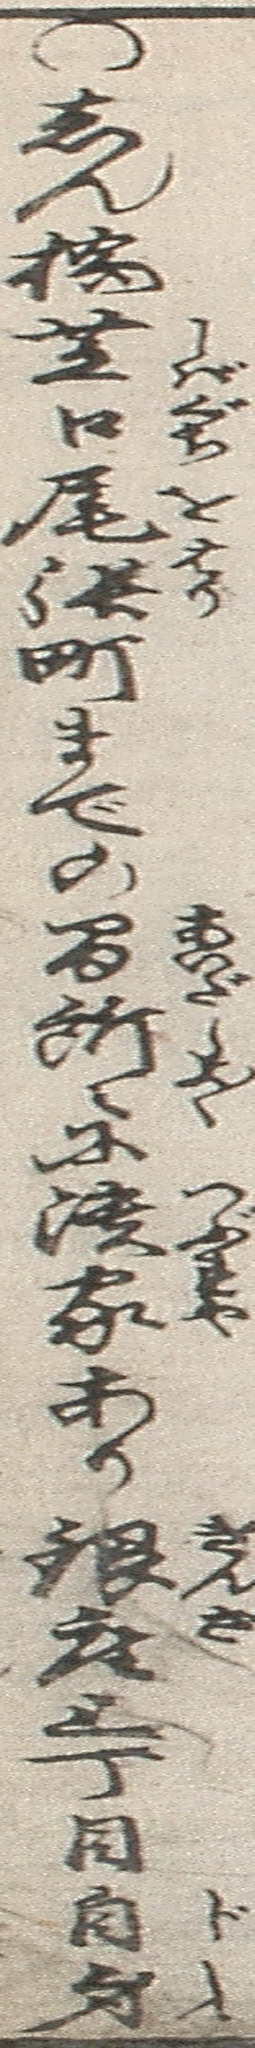◯しん橋芝口尾張町までの間所々に潰家あり銀座三丁目自身
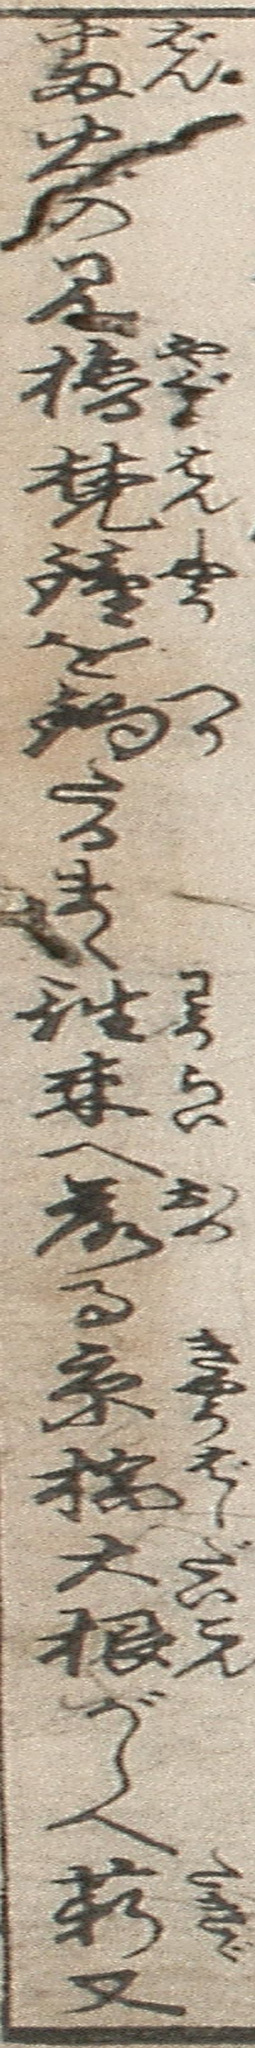番火の見櫓梵鐘を釣たるまゝ往来へ落る京橋大根ばしへ薪又

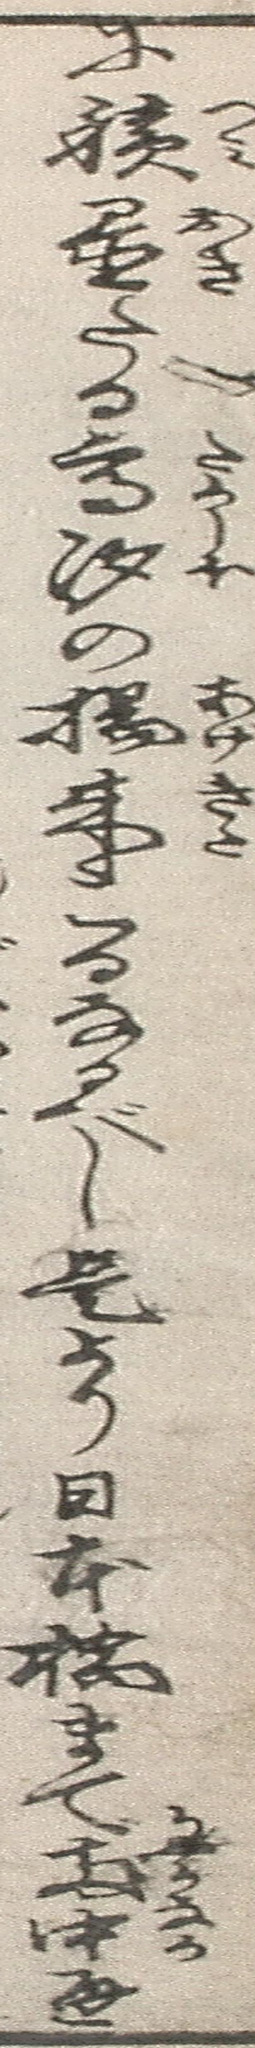に積置たる高汐の揚来るなるべし是より日本橋まで両中通
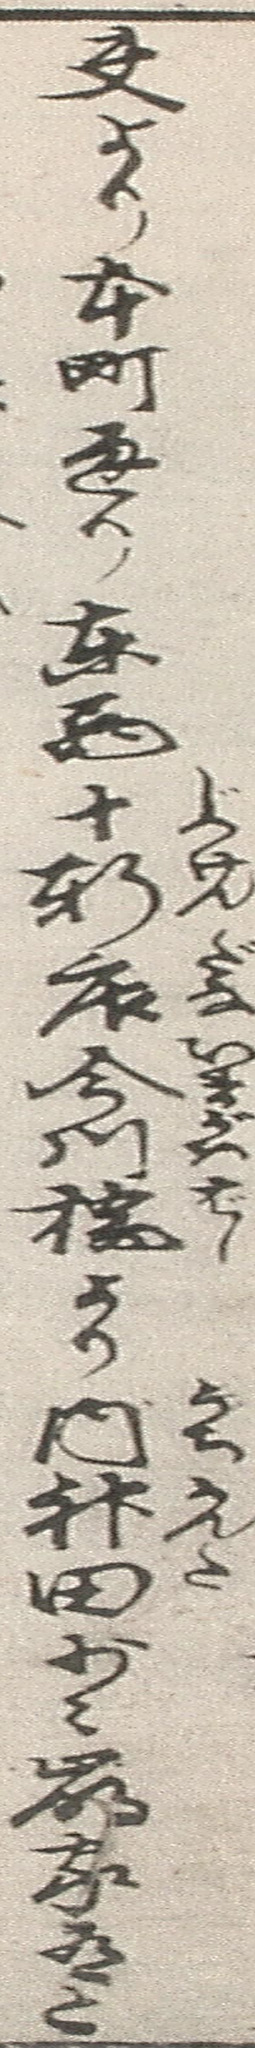夫より本町通り東西十軒店今川橋より内神田少々崩家有と
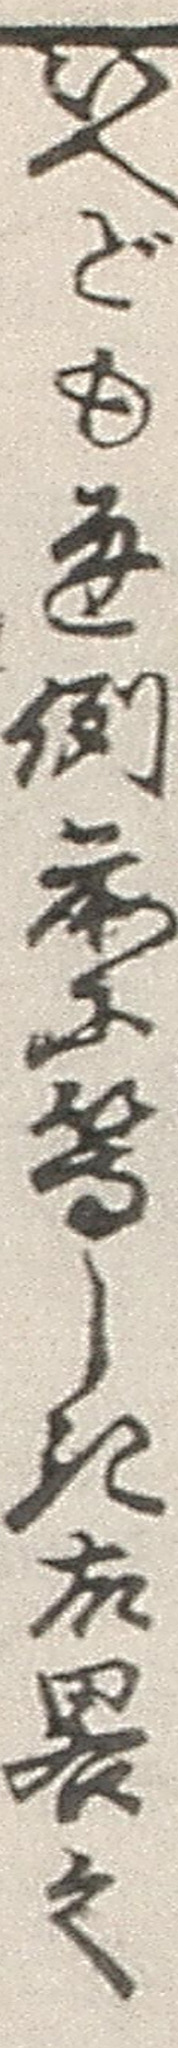いへども通例前に等しき故略之
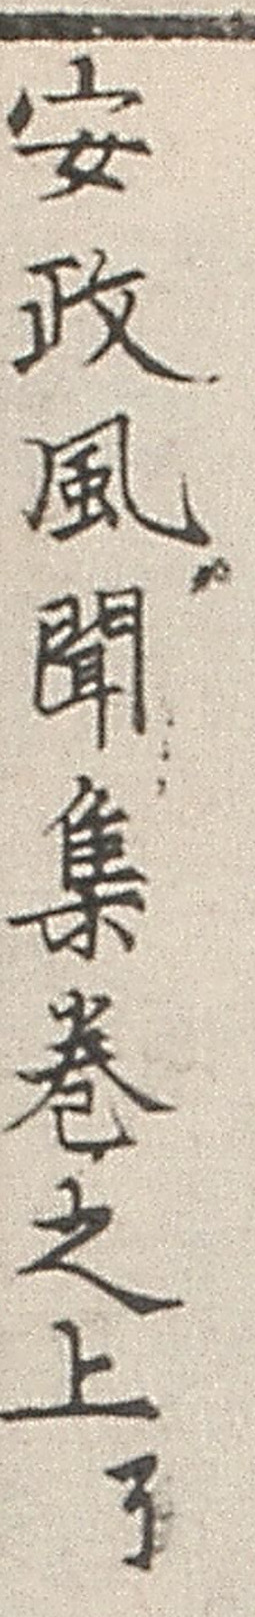安政風聞集巻之上了
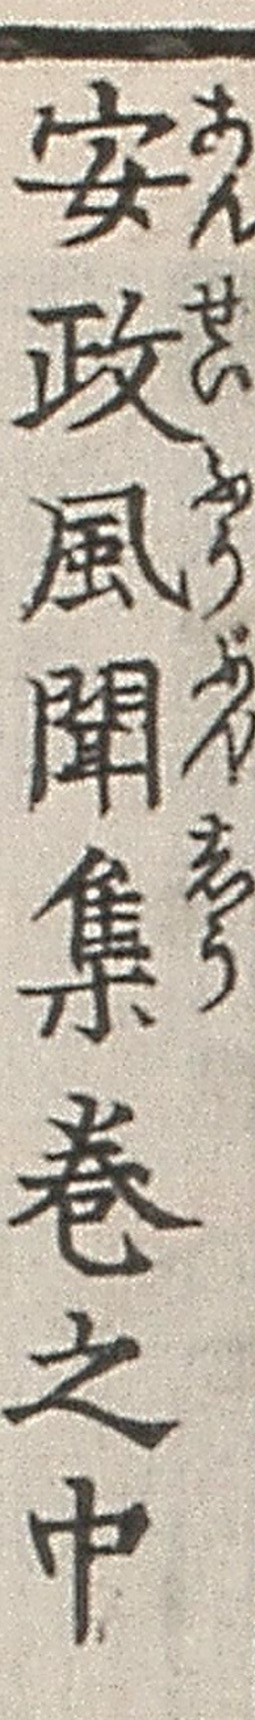安政風聞集巻之中
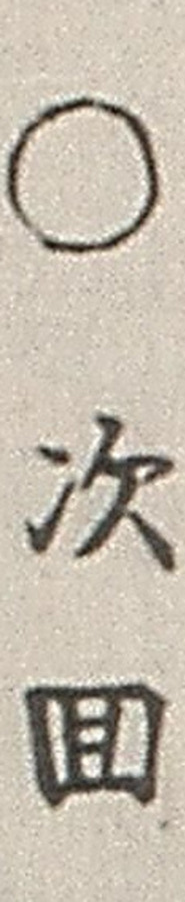◯次回
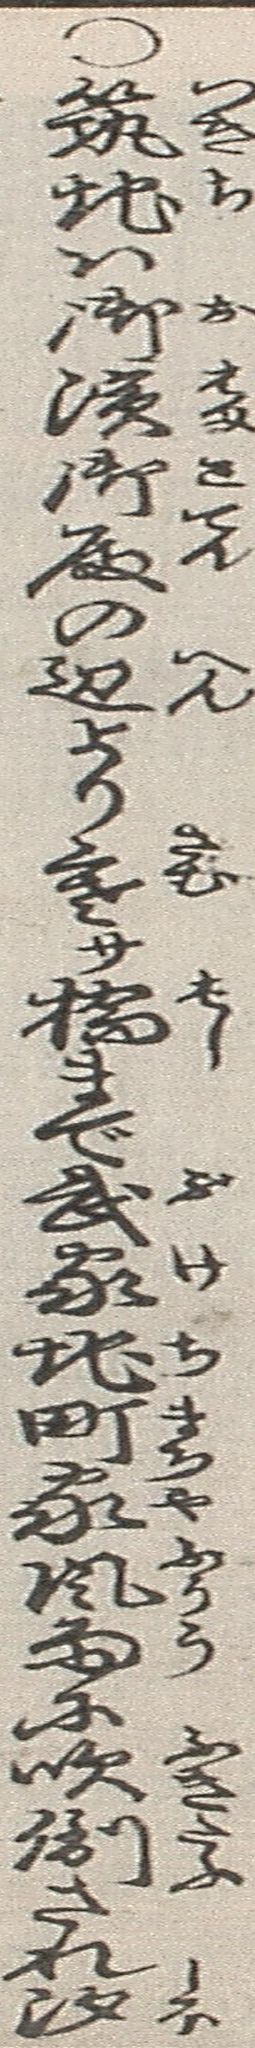◯築地ハ御浜御殿の辺より寒サ橋まで武家地町屋風雨に吹倒され汐
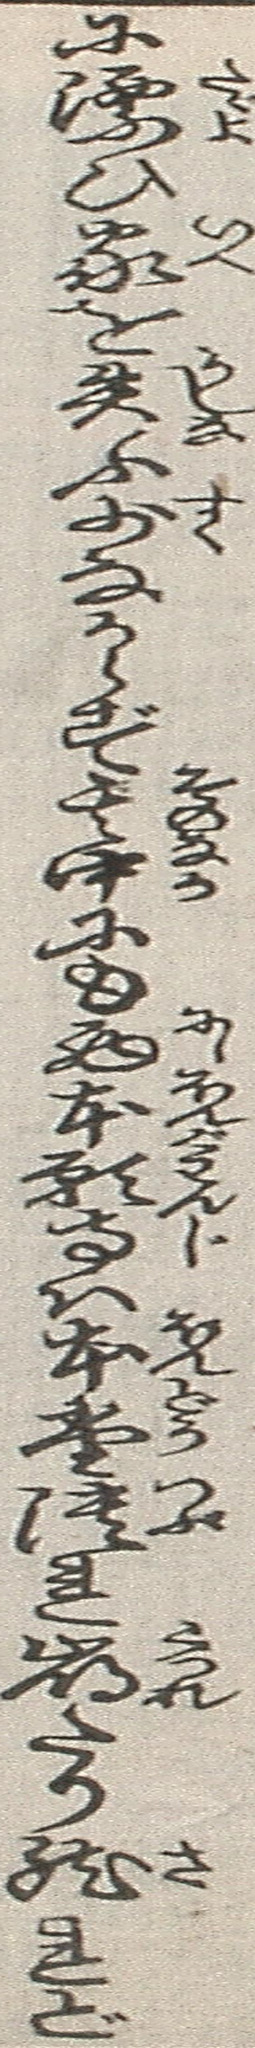に漂ひ家を失ふ少なからず其中にも西本願寺ハ本堂潰れ崩たり然れど
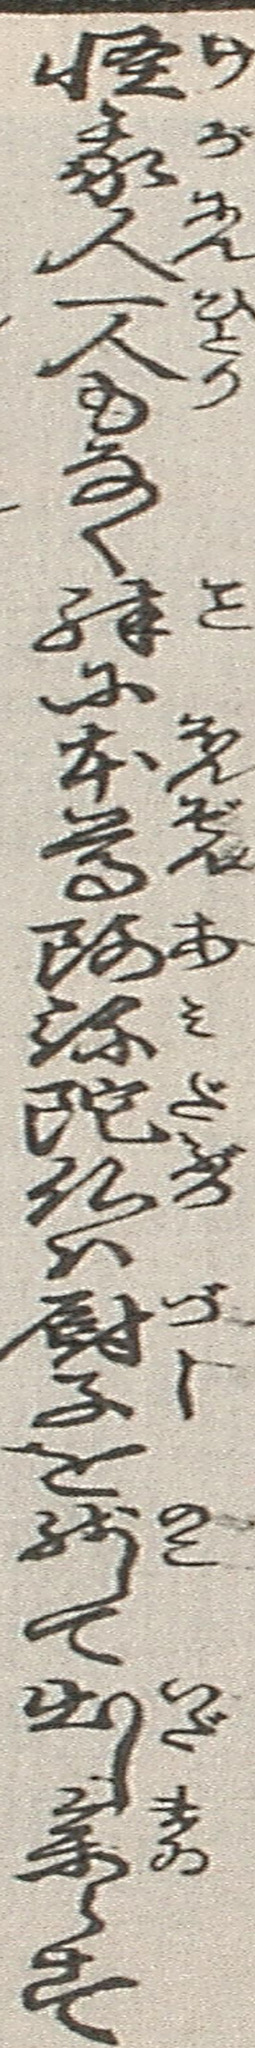怪我人一人もなく殊に本尊阿弥陀仏ハ厨子を残して出し参らす
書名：安政風聞集　上中下　全
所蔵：東京大学地震研究所図書室 Earthquake Research Institute Library, The University of Tokyo, JAPAN
